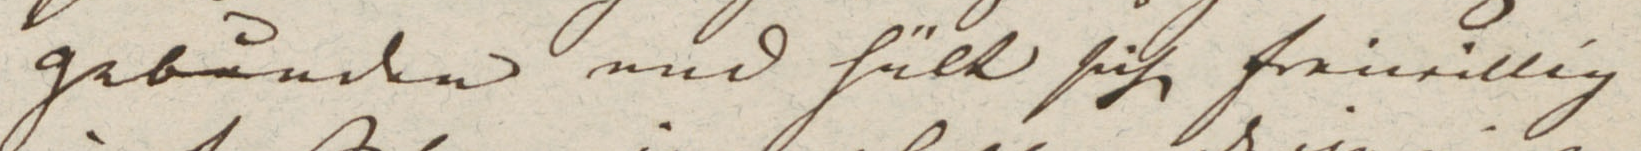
gebunden und hält sich freiwillig
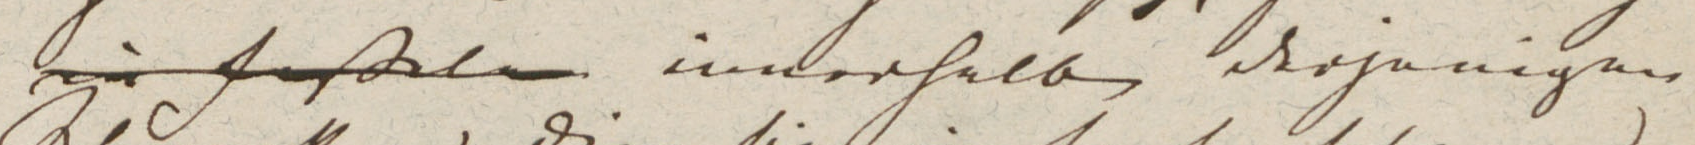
in Fesseln innerhalb derjenigen
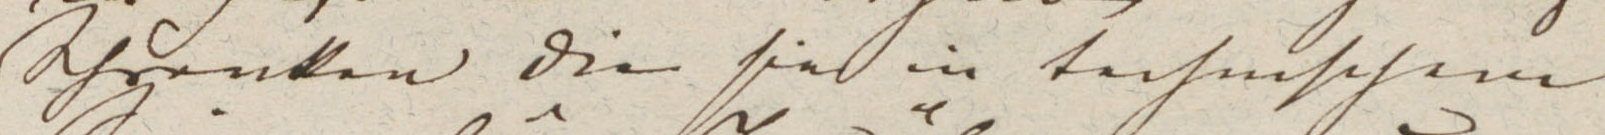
Schranken die sie in technischem
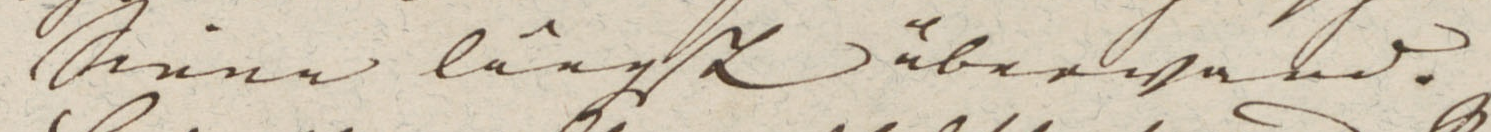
Sinne längst überwand.
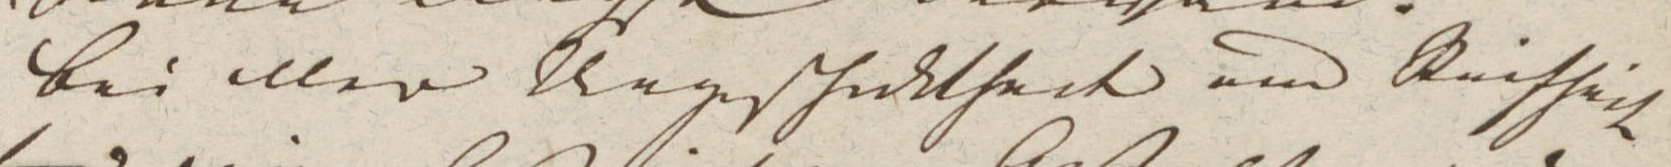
Bei aller Ungeschicktheit und Steifheit
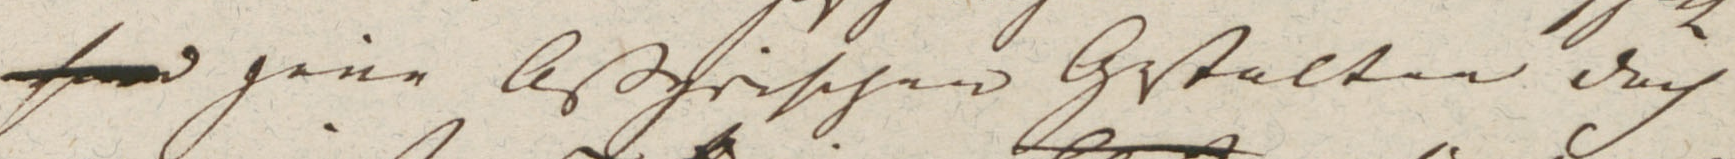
sind jene Assyrischen Gestalten doch
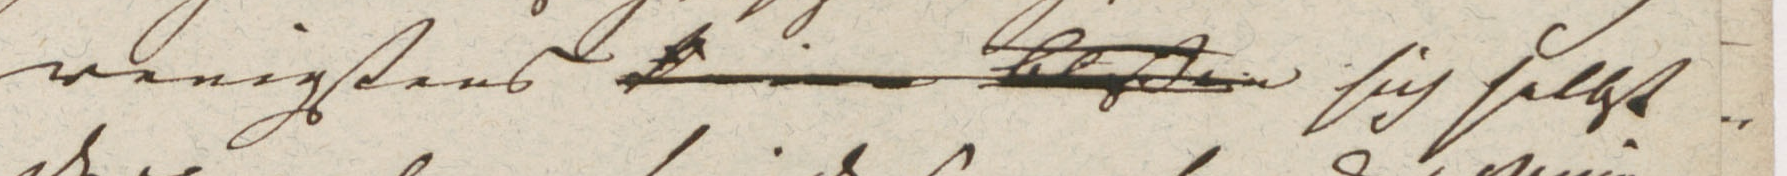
wenigstens keine sich selbst
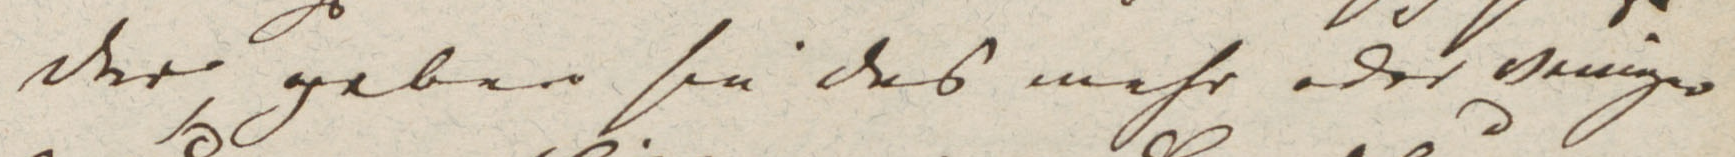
dar, geben sie das mehr oder weniger
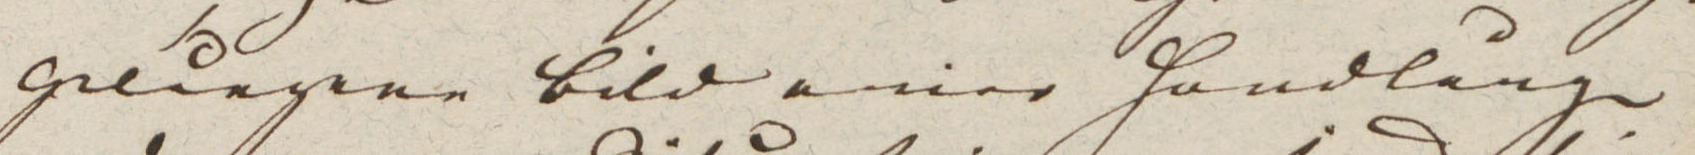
gelungene Bild einer Handlung
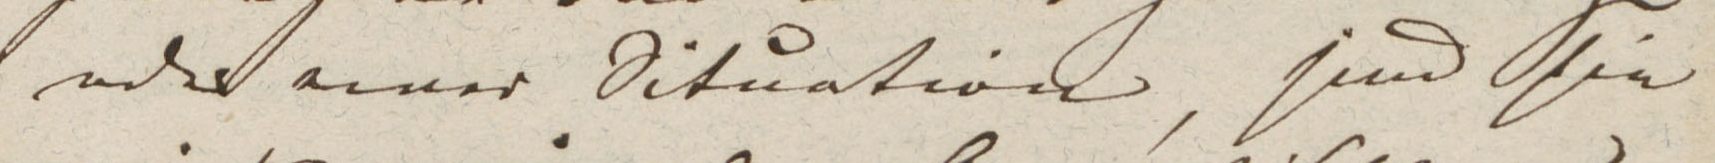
oder einer Situation, sind sie
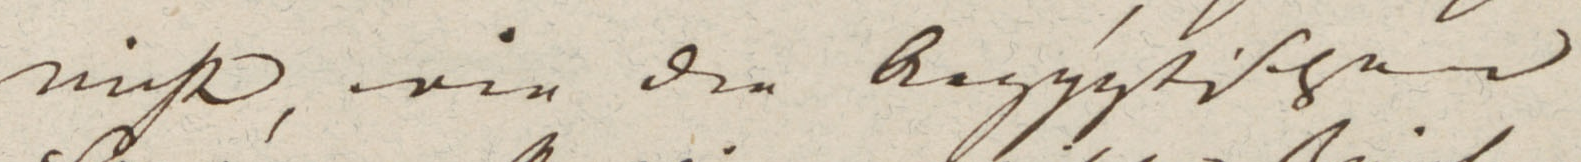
nicht, wie die Aegyptischen
